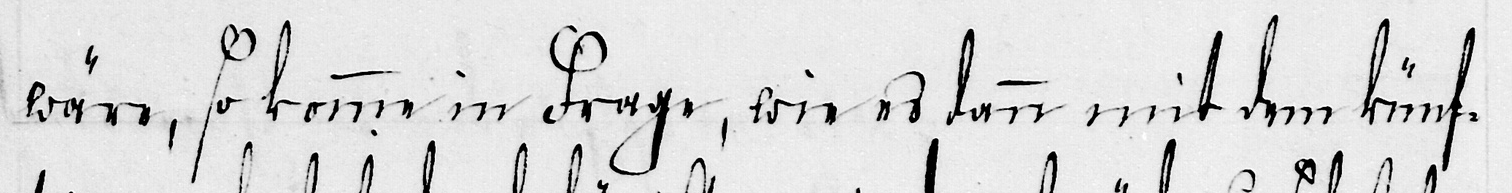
wäre, so komme in Frage, wie es dann mit dem künf¬
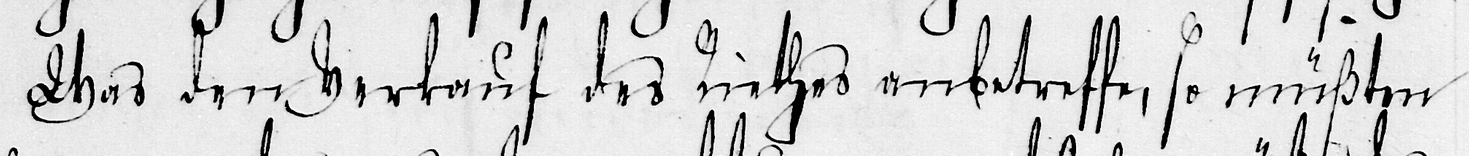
Was den Verkauf des Riethes anbetreffe, so müßten
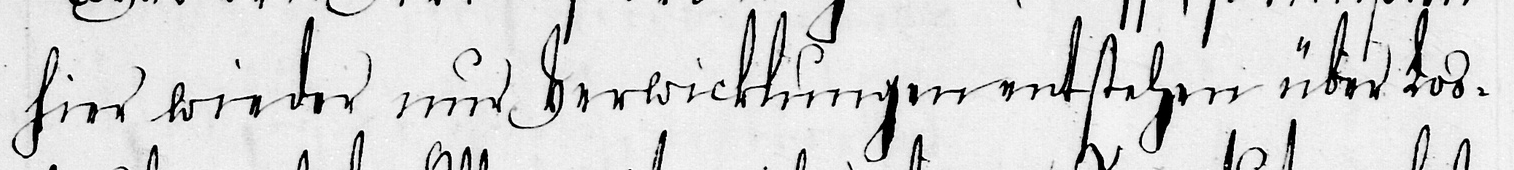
hier wieder nur Verwicklungen entstehen über Los¬
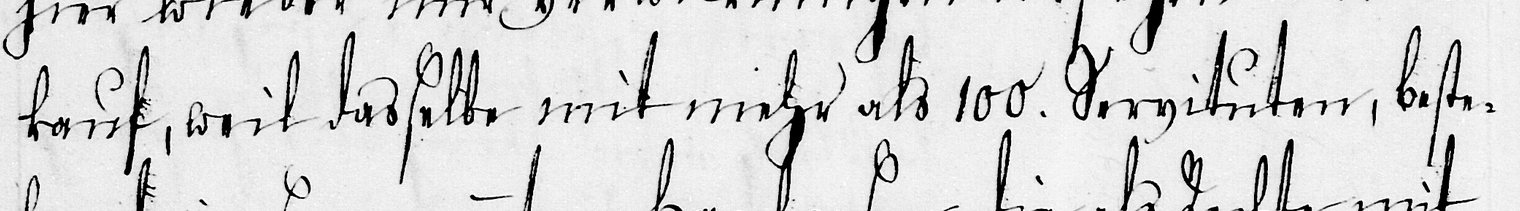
kauf, weil dasselbe mit mehr als 100. Servituten, beste¬
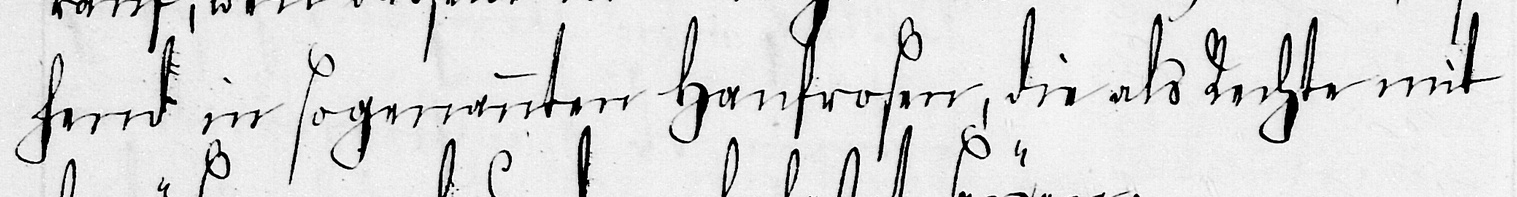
hend in sogenannten Hanfrosen, die als Rechte mit
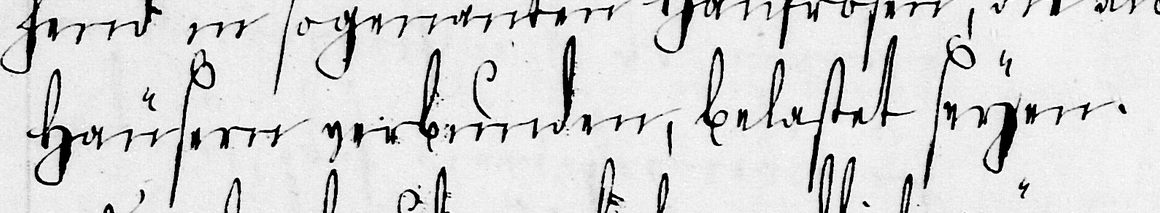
Häusern verbunden, belastet seyen.
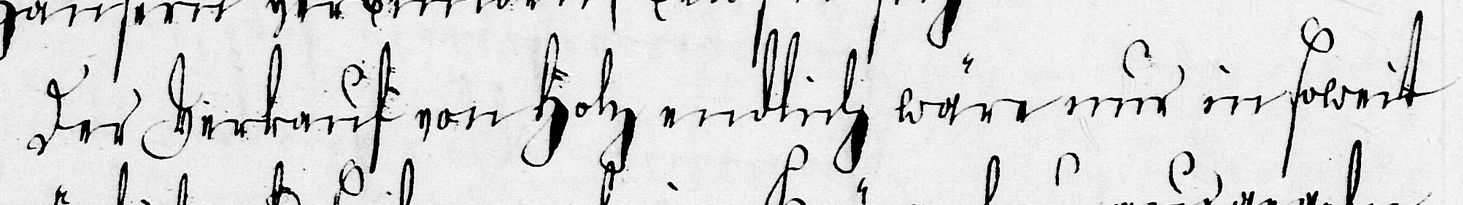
Der Verkauf von Holz endlich wäre nur in soweit
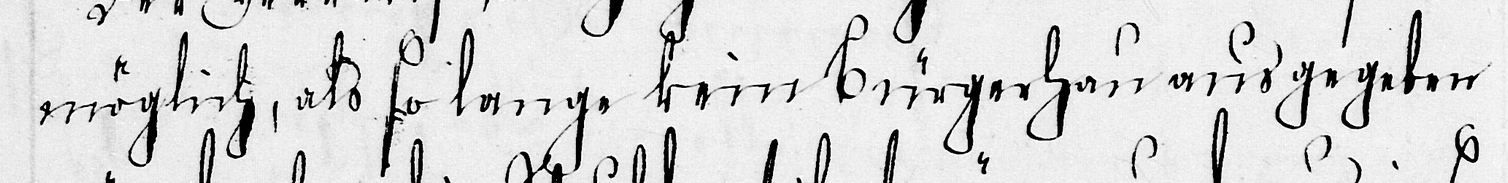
möglich, als so lange kein Bürgerhau ausgegeben
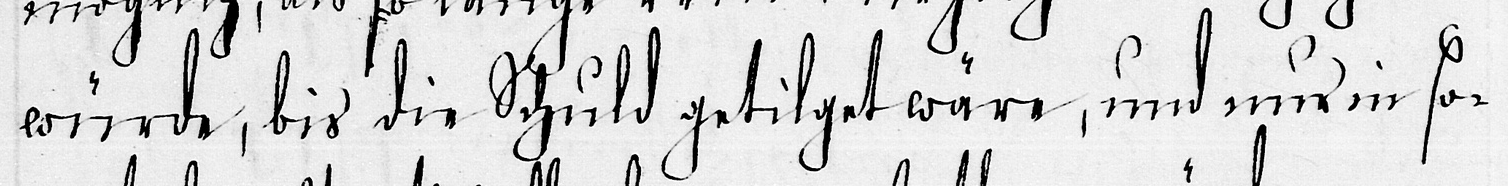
würde, bis die Schuld getilget wäre, und nur in so¬
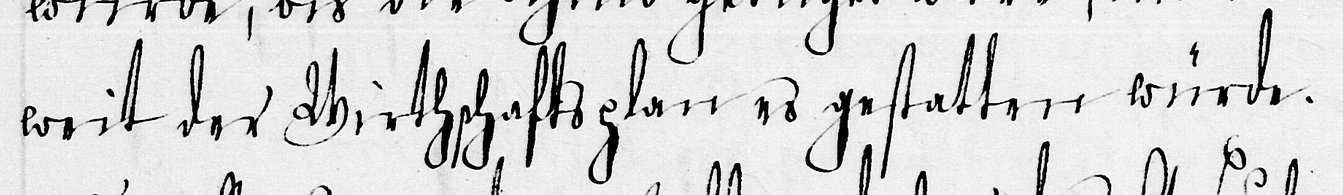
weit der Wirthschaftsplan es gestatten würde.
